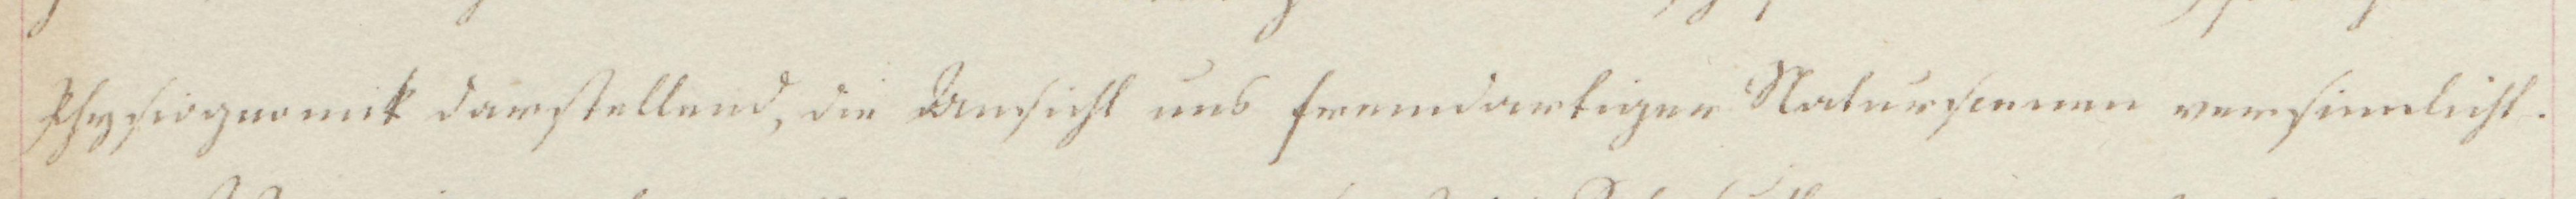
Physiognomik darstellend, die Ansicht uns fremdartiger Naturscenen versinnlicht.
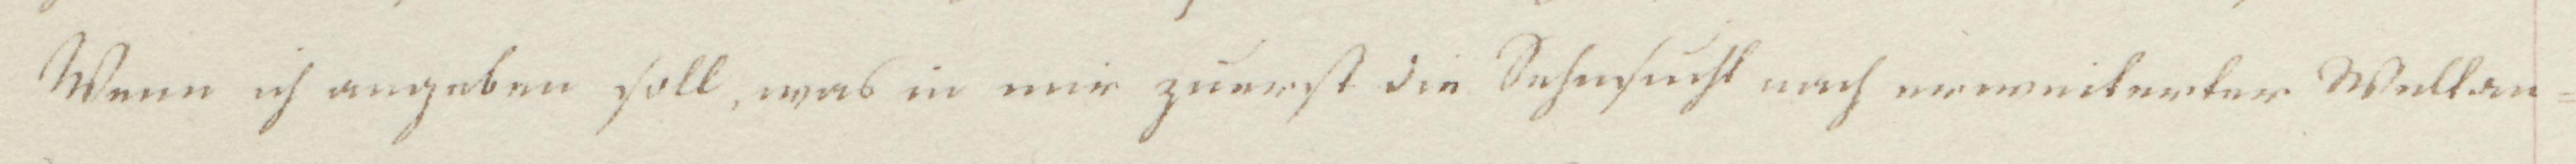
Wenn ich angeben soll, was in mir zuerst die Sehnsucht nach erweiterter Weltan-
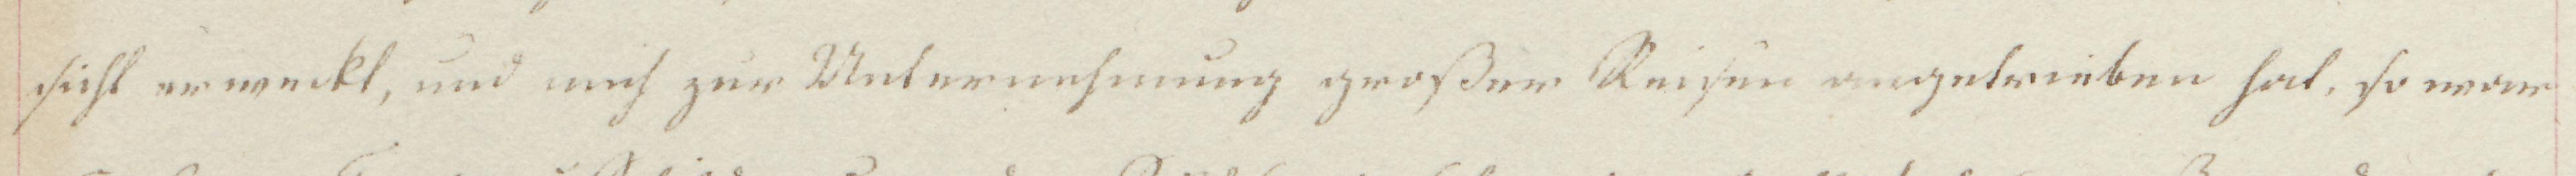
sicht erweckt, und mich zur Unternehmung großer Reisen angetrieben hat, so war
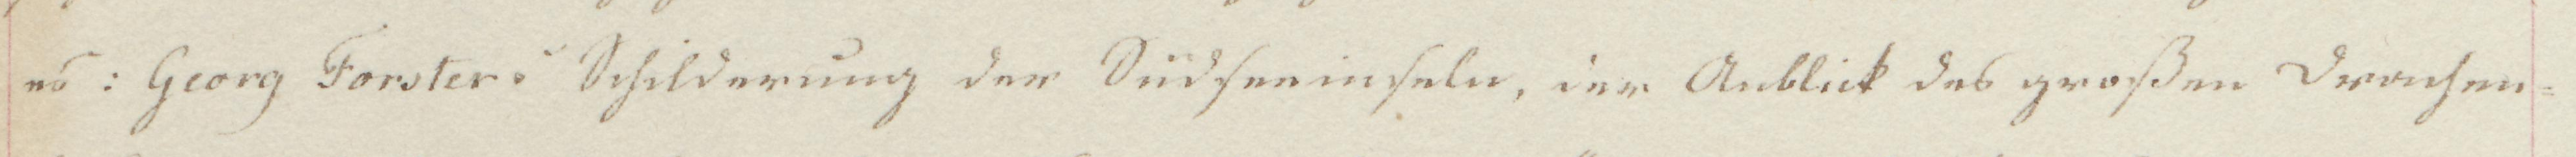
es: Georg Forsters Schilderung der Südseeinseln, der Anblick des großen Drachen-
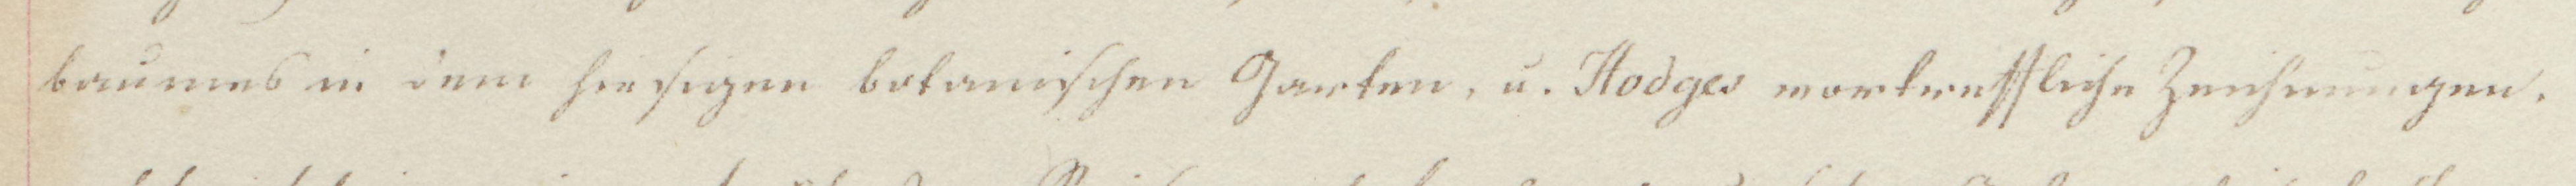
baumes in dem hiesigen botanischen Garten, u. Hodges vortreffliche Zeichnungen,
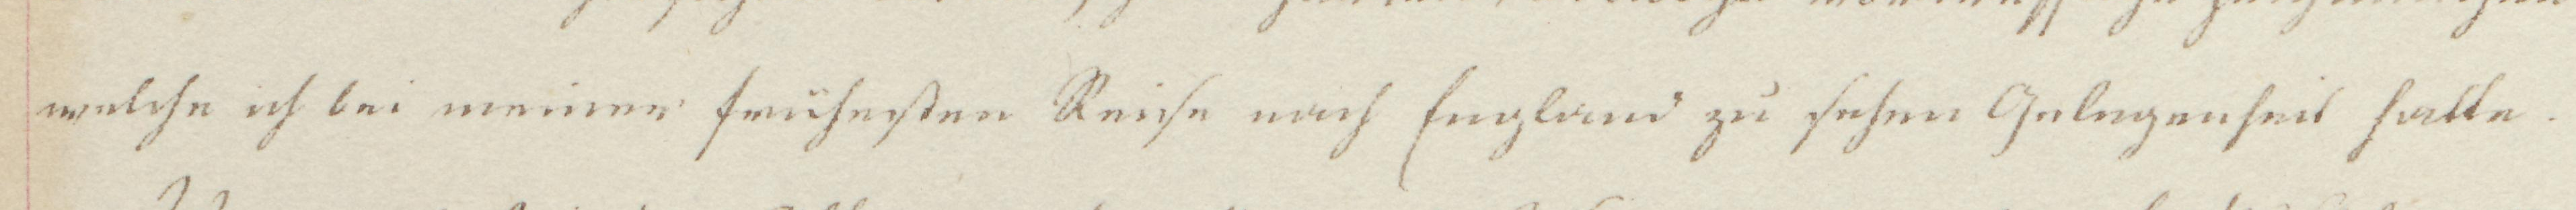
welche ich bei meiner frühesten Reise nach England zu sehen Gelegenheit hatte.
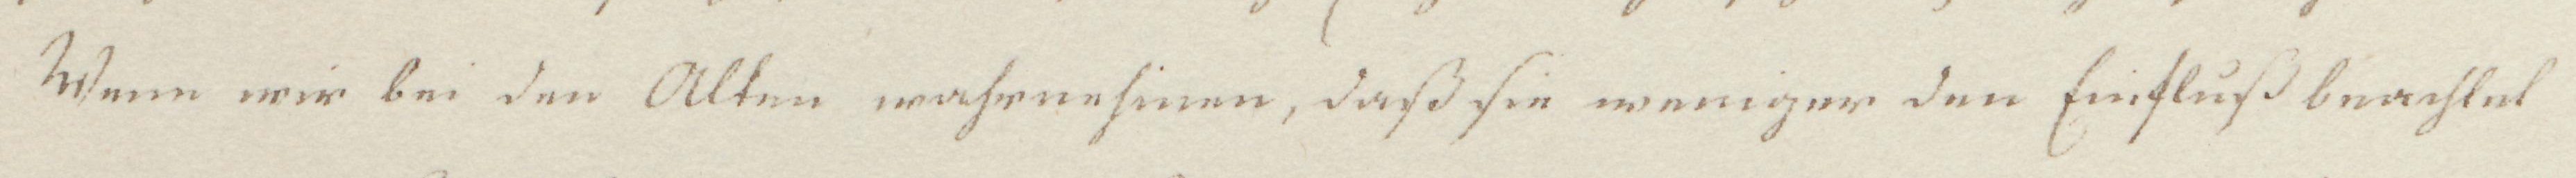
Wenn wir bei den Alten wahrnehmen, daß sie weniger den Einfluß beachtet
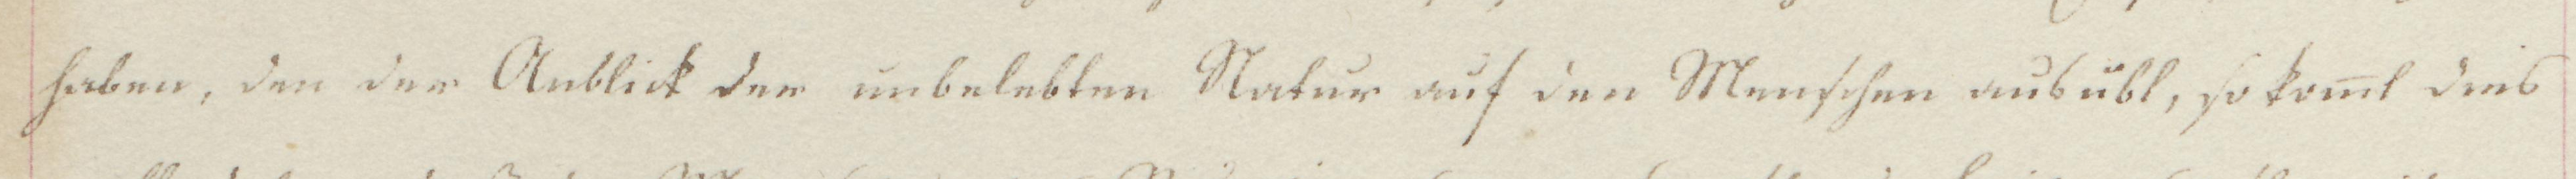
haben, den der Anblick der unbelebten Natur auf den Menschen ausübt, so kom̃t dies
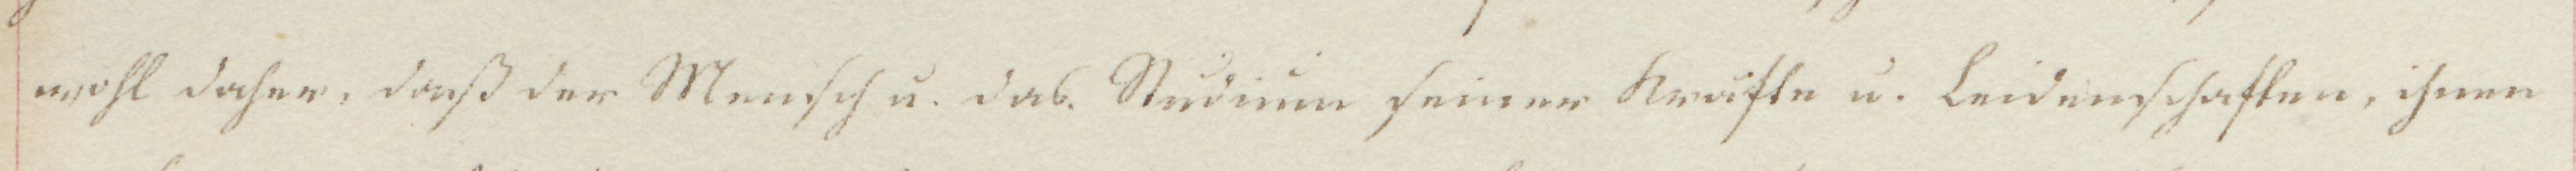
wohl daher, daß der Mensch u. das Studium seiner Kräfte u. Leidenschaften, ihnen
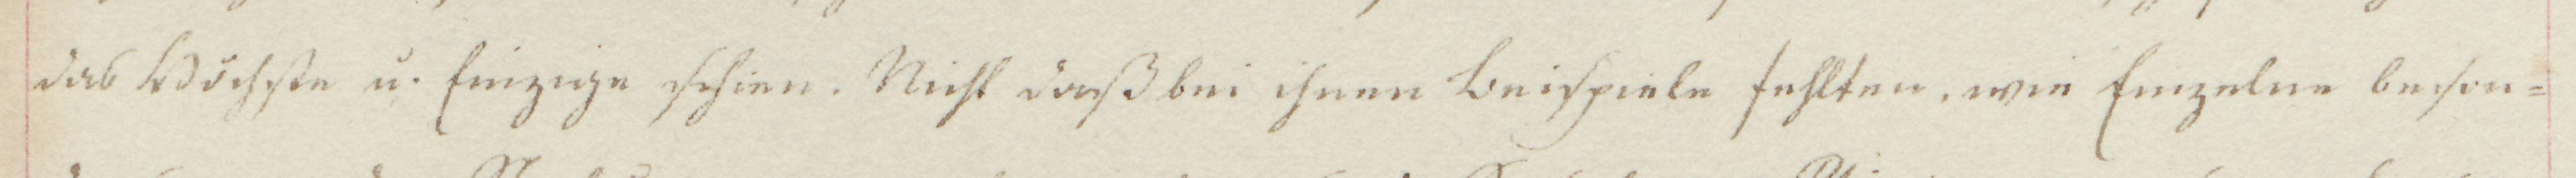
das Höchste u. Einzige schien. Nicht daß bei ihnen Beispiele fehlten, wie Einzelne beson-
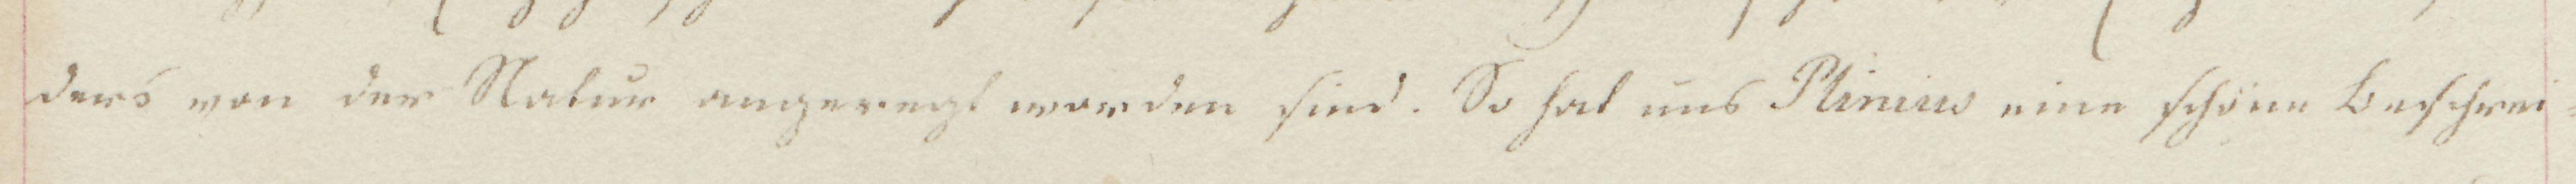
ders von der Natur angeregt worden sind. So hat uns Plinius eine schöne Beschrei-
